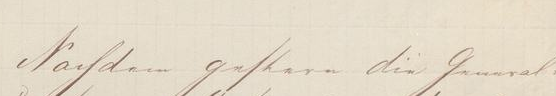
Nachdem gestern die General-
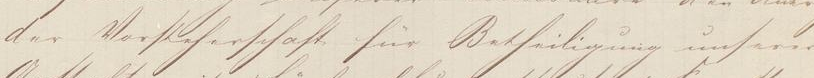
der Vorsteherschaft für Betheiligung unserer
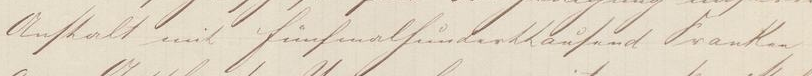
Anstalt mit fünfmalhunderttausend Franken
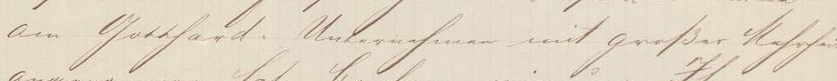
am Gotthard-Unternehmen mit großer Mehrheit
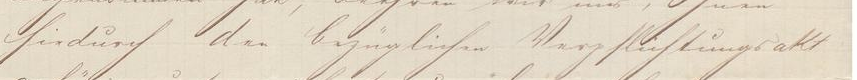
hiedurch den bezüglichen Verpflichtungsakt
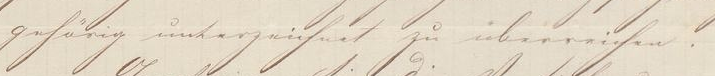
gehörig unterzeichnet zu überreichen.
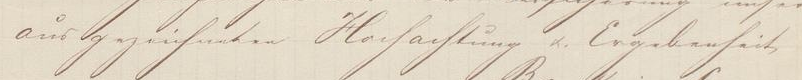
ausgezeichneten Hochachtung &. Ergebenheit
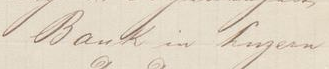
Bank in Luzern
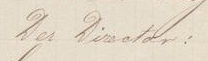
Der Director:
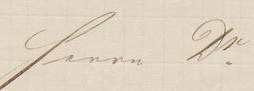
Herrn Dr
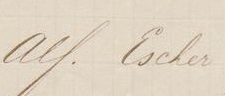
Alf. Escher
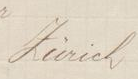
Zürich
